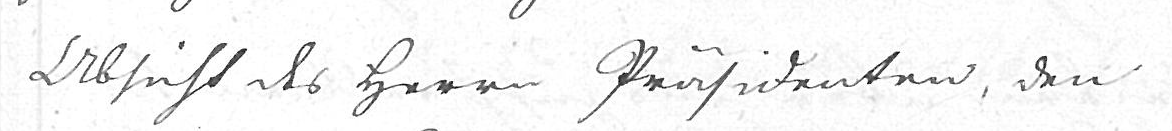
Absicht des Herrn Präsidenten, den
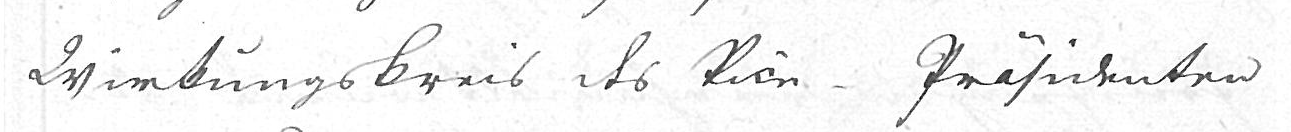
Wirkungskreis des Vice-Präsidenten
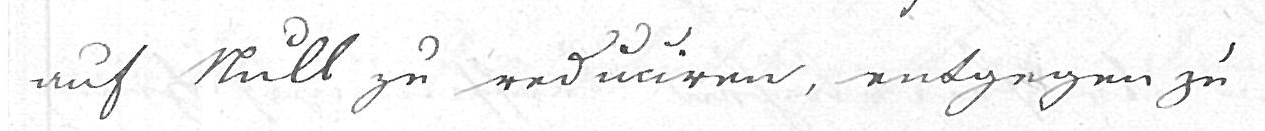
auf Null zu reduciren, entgegen zu
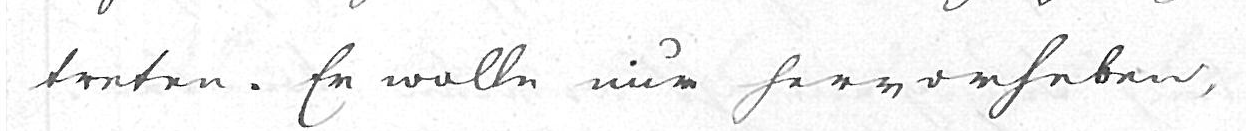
treten. Er wolle nur hervorheben,
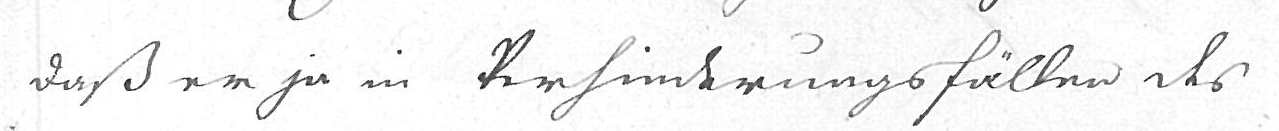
daß er ja in Verhinderungsfällen des
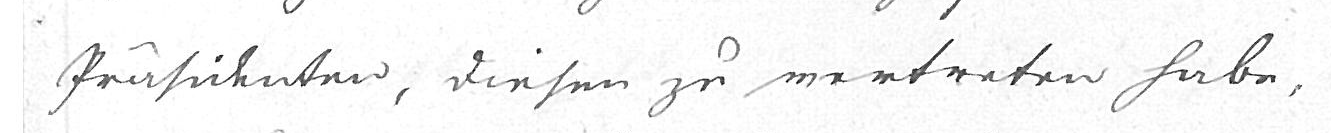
Präsidenten, diesen zu vertreten habe.
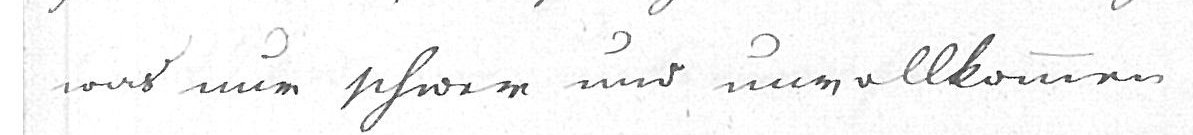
was nur schwer und unvollkommen
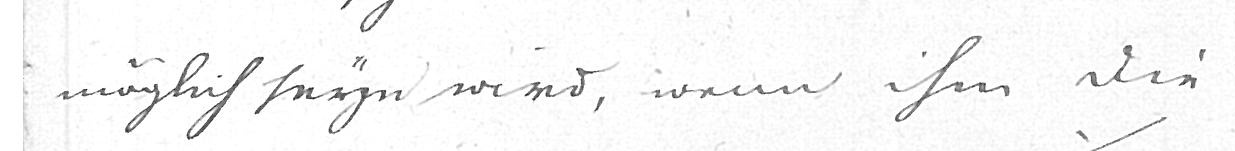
möglich seyn wird, wenn ihm die
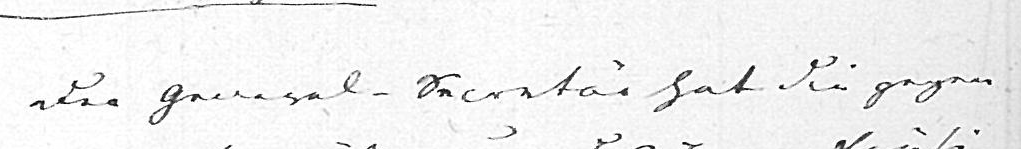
Der General-Secretär hat die gegen
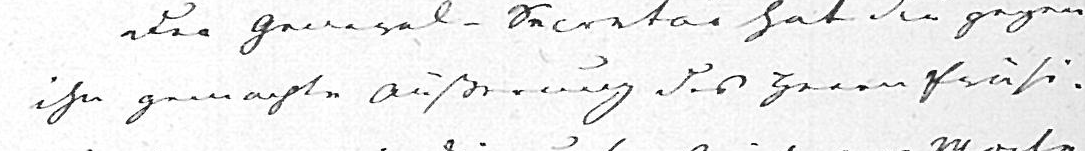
ihn gemachte Äußerung des Herrn Präsi-
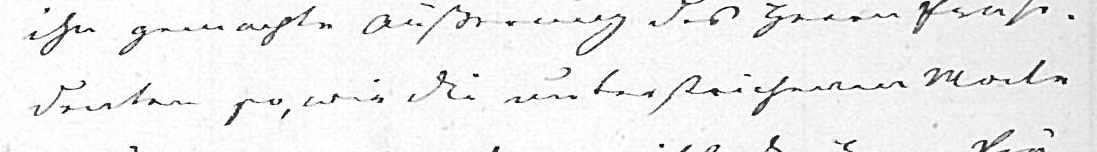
denten so, wie die unterstrichenen Worte
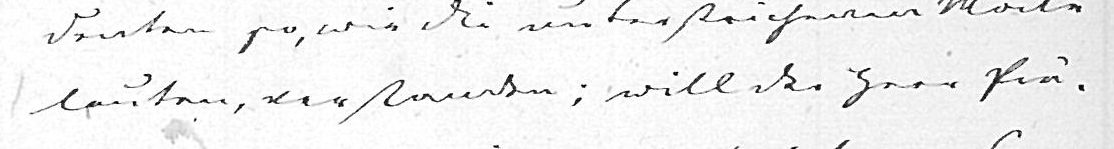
lauten, verstanden; will der Herr Prä-
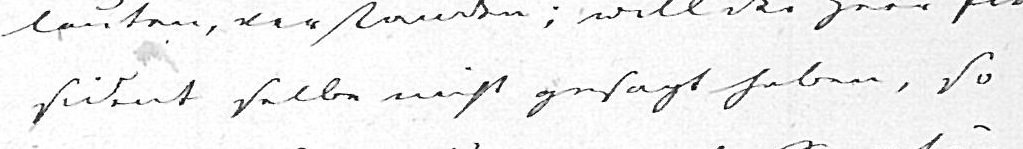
sident selbe nicht gesagt haben, so
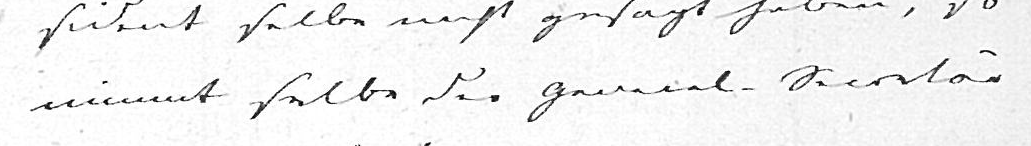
nimmt selbe der General-Secretär
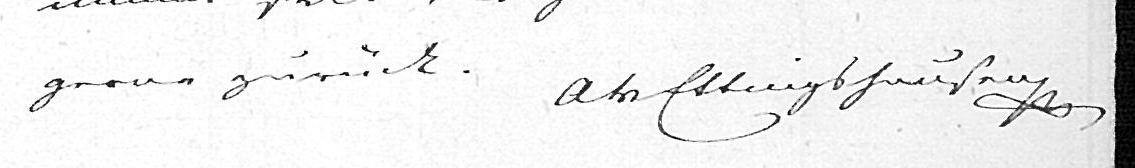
gerne zurück. AvEttingshausen
